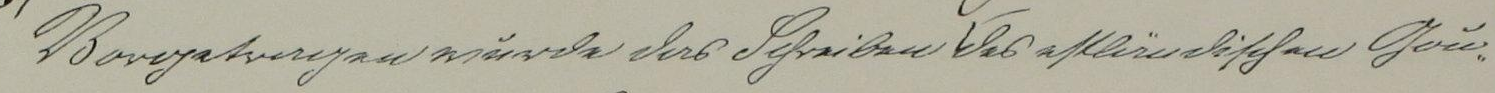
Vorgetragen wurde das Schreiben des estländischen Gou-
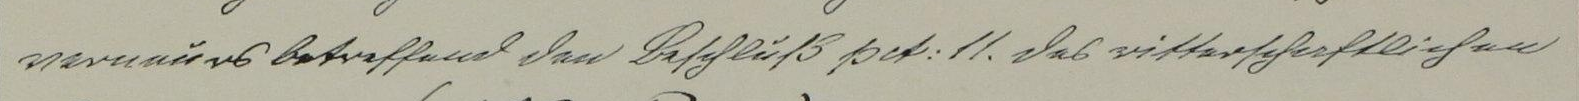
verneurs betreffend den Beschluß pct. 11. des ritterschaftlichen
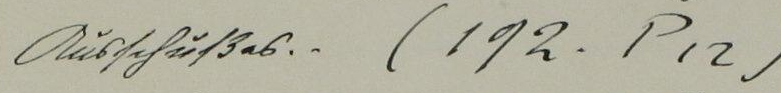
Ausschußes. (192. P12)
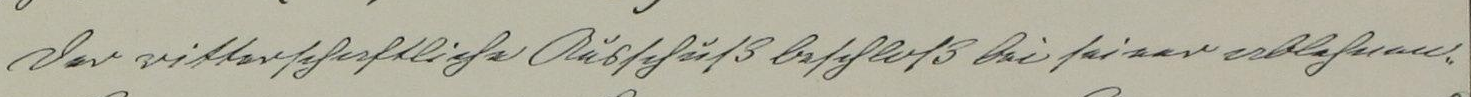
Der ritterschaftliche Ausschuß beschloß bei seiner ablehnen-
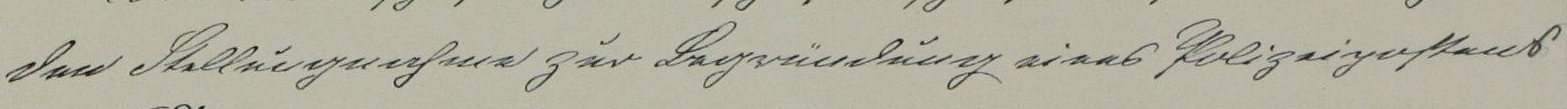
den Stellungnahme zur Begründung eines Polizeipostens
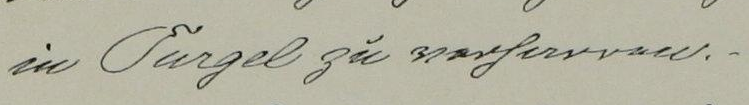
in Turgel zu verharren.
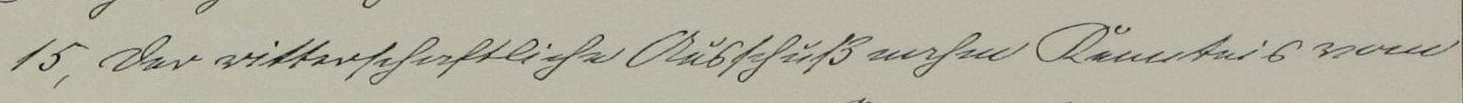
15. Der ritterschaftliche Ausschuß nahm Kenntnis vom
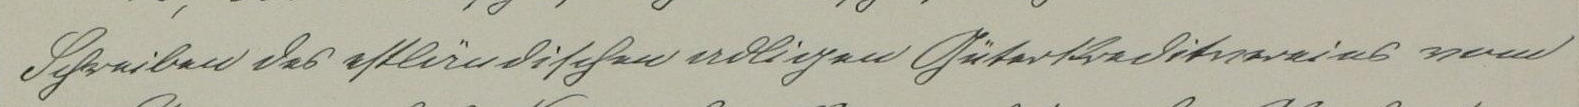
Schreiben des estländischen adligen Güterkreditvereins vom
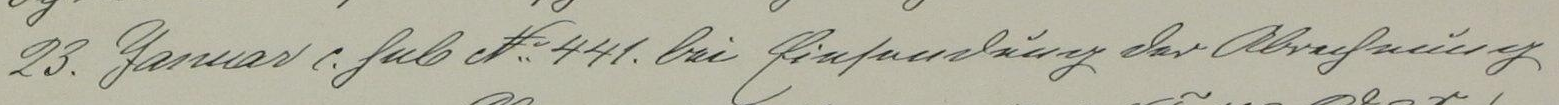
23. Januar c. sub No. 441. bei Einsendung der Abrechnung
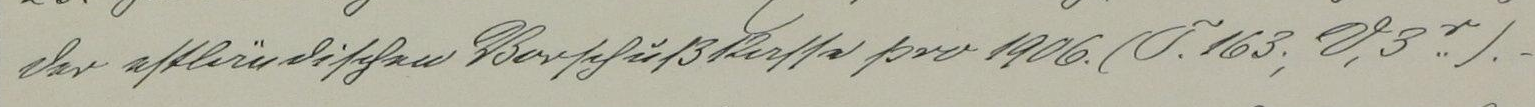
der estländischen Vorschußkasse pro 1906. (T.163; V.3r).
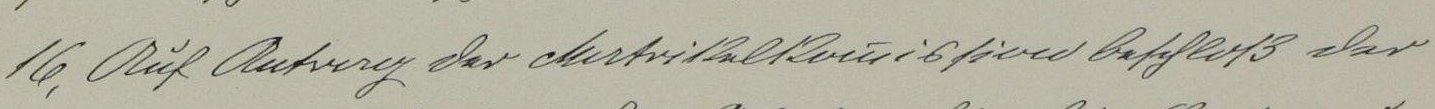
16. Auf Antrag der Matrikelkommission beschloß der
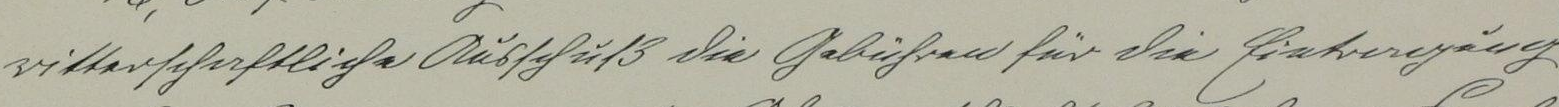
ritterschaftliche Ausschuß die Gebühren für die Eintragung
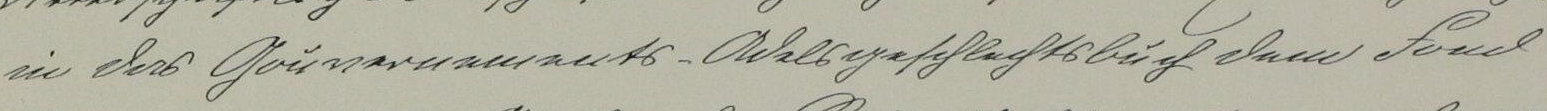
in das Gouvernements-Adelsgeschlechtsbuch dem Fond
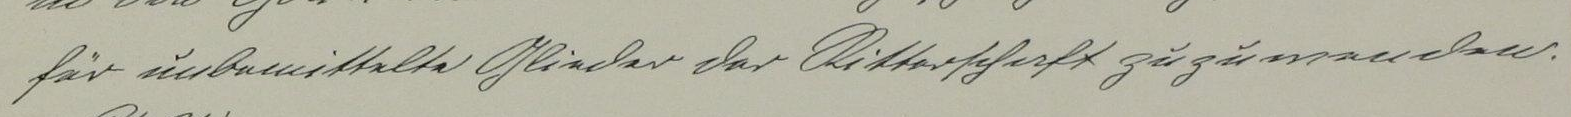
für unbemittelte Glieder der Ritterschaft zuzuwenden.
